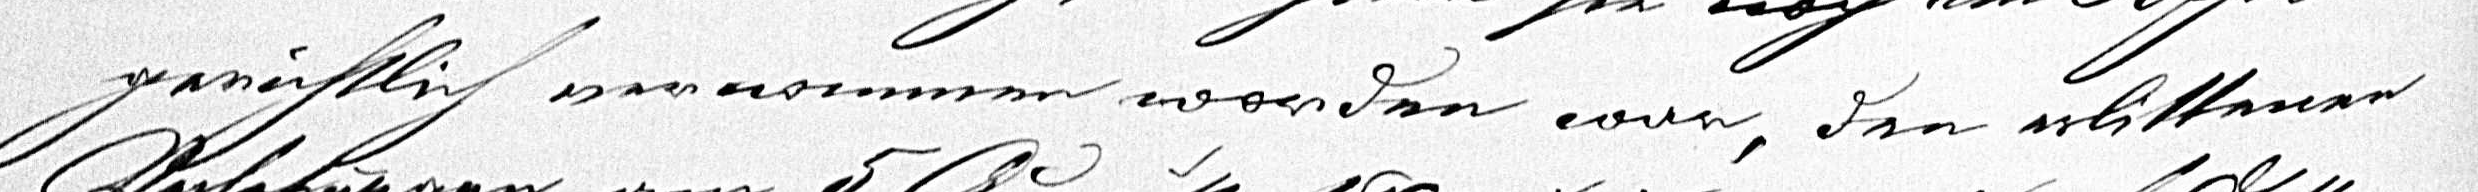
gerichtlich vernommen worden war, den erlittenen
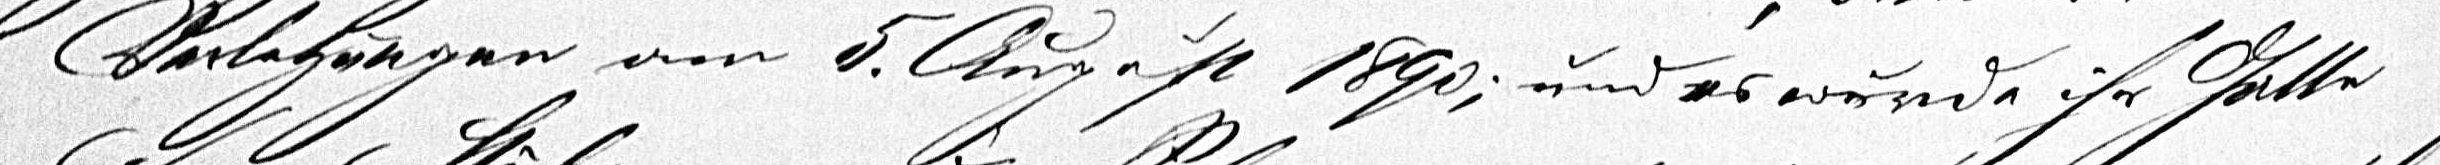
Verletzungen am 5. August 1890; und es wurde ihr Gatte
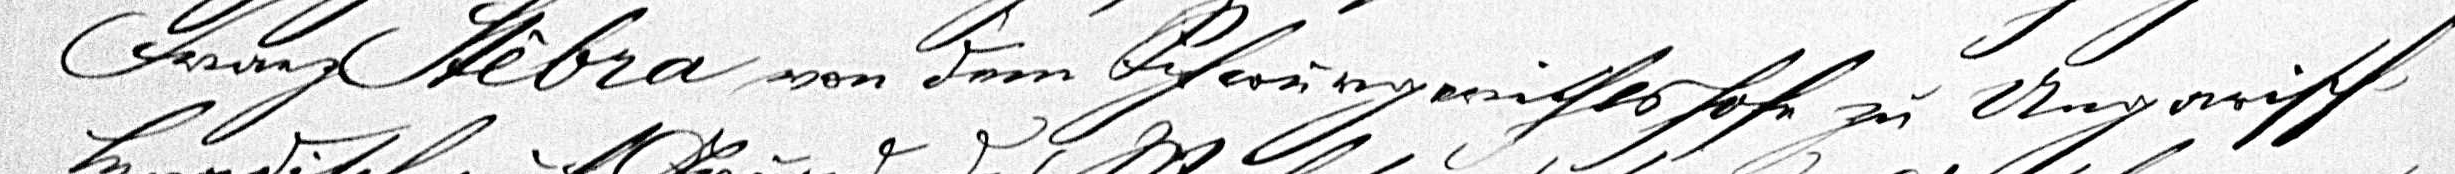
Franz Stebra von dem Schwurgerichtshofe zu Ungarisch
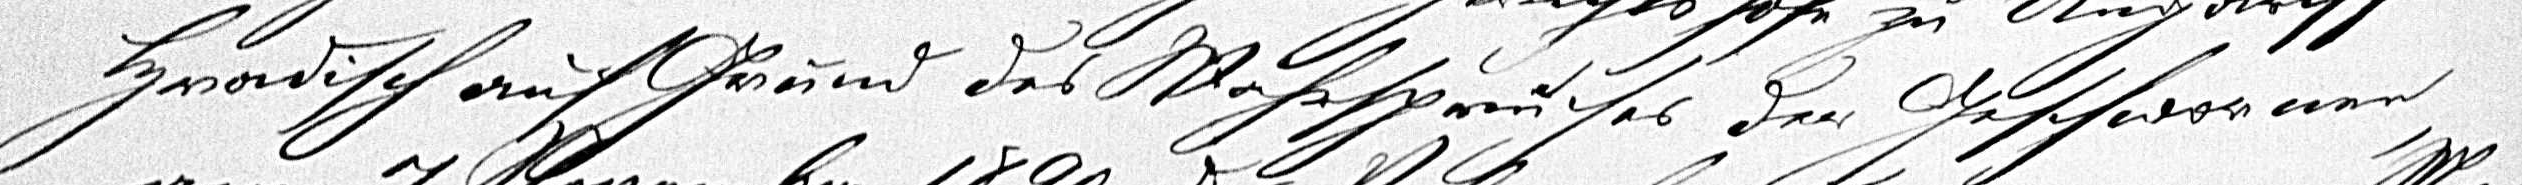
Gradisch auf Grund des Wahrspruches der Geschwornen,
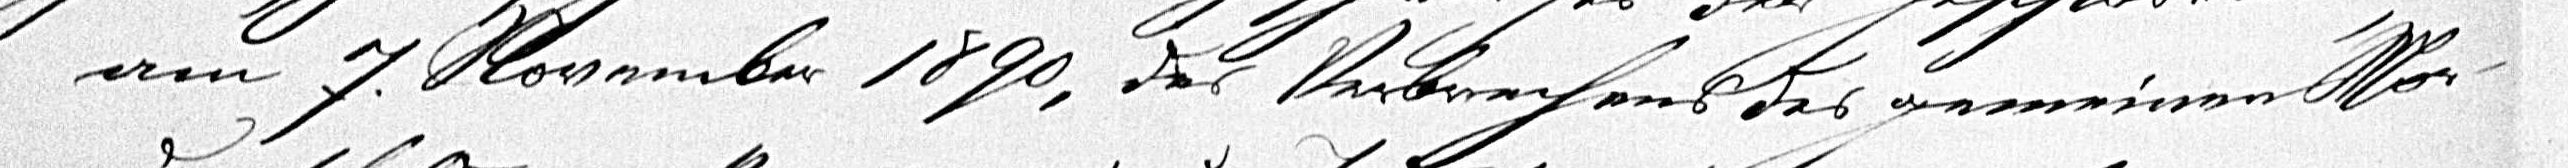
am 7. November 1890, des Verbrechens des gemeinen Mor¬
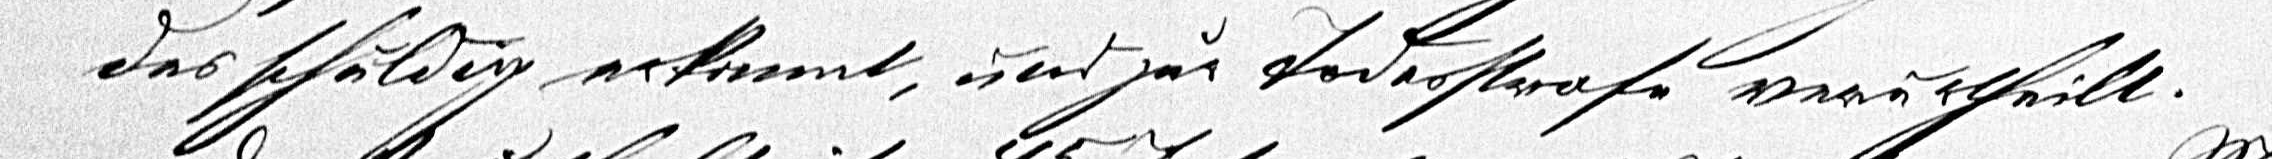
des schuldig erkannt, und zur Todesstrafe verurtheilt.
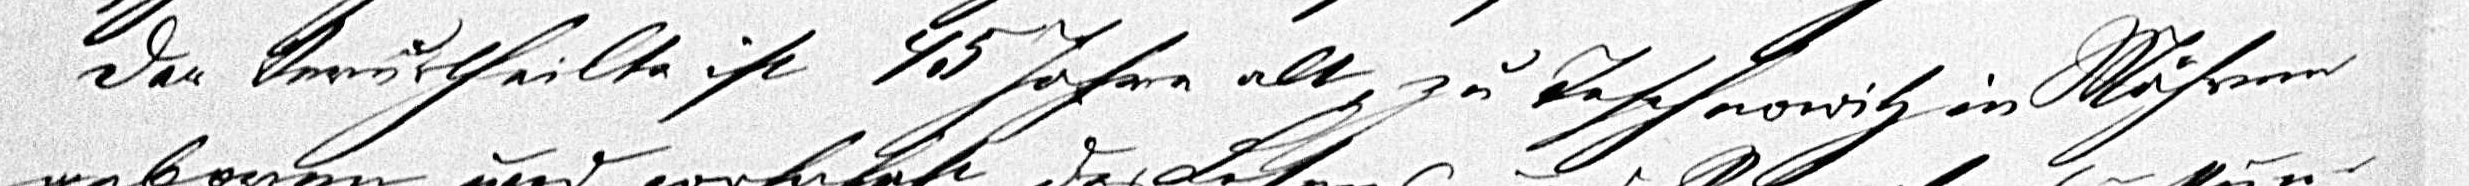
Der Verurtheilte ist 45 Jahre alt, zu Teschnowitz in Während
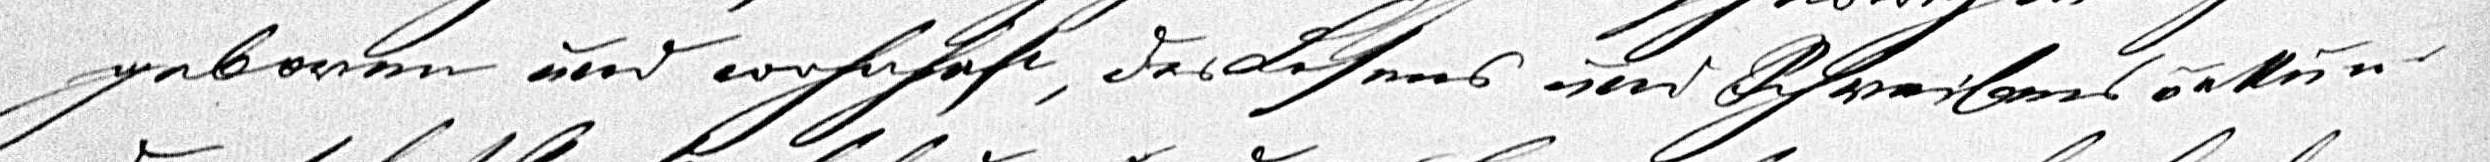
geboren und wohnhaft, des Lesens und Schreibers xxkun¬
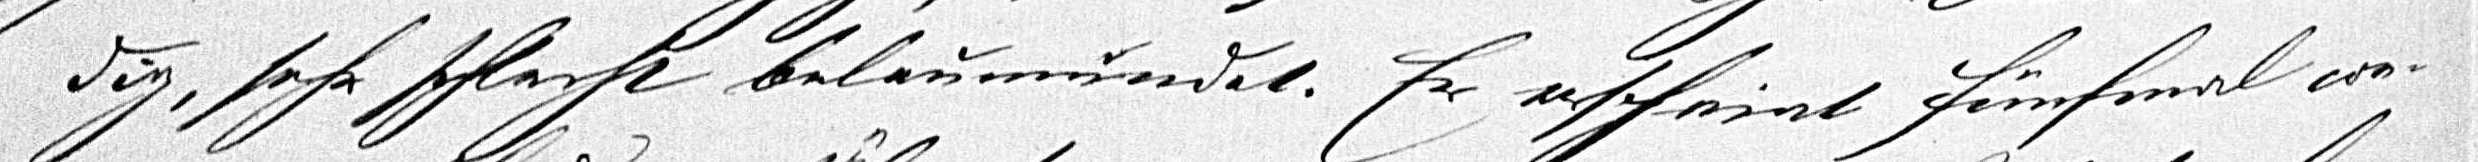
dig, sehr schlecht beleumundet. Er erscheint fünfmal we¬
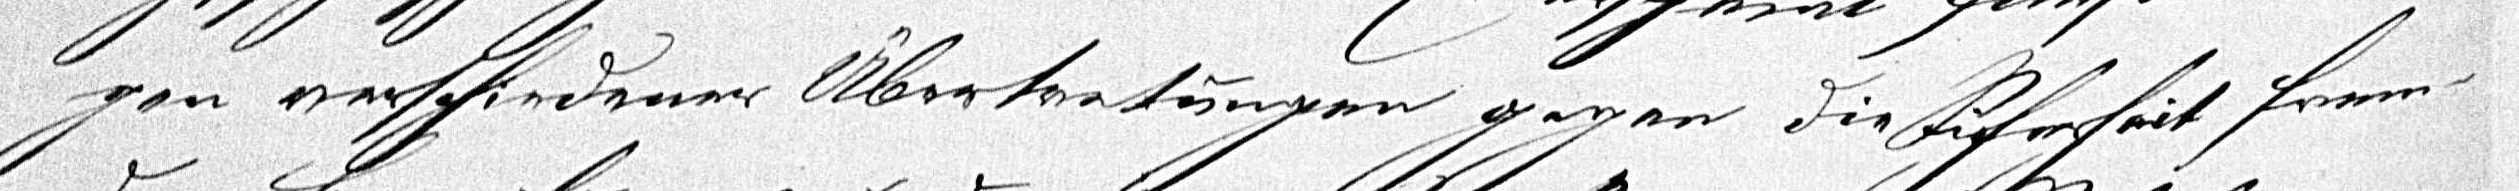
gen verschiedener Übertretungen gegen die Sicherheit frem¬
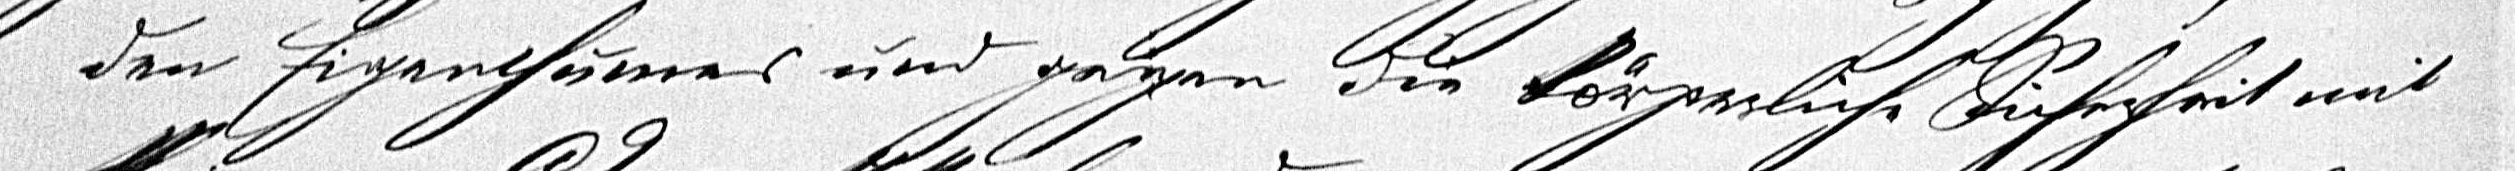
den Eigenthumes und gegen die körperliche Sicherheit mit
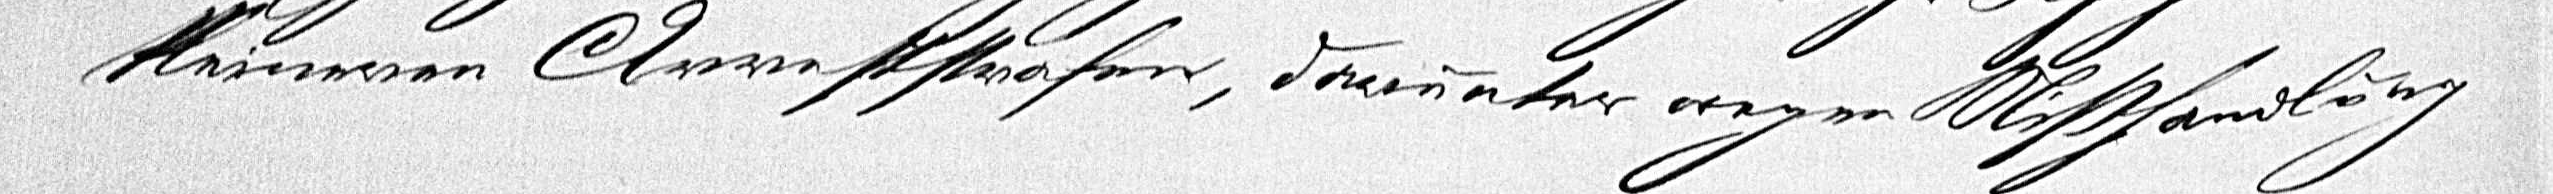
keineren Arreststrafen, darunter wegen Mißhandlung
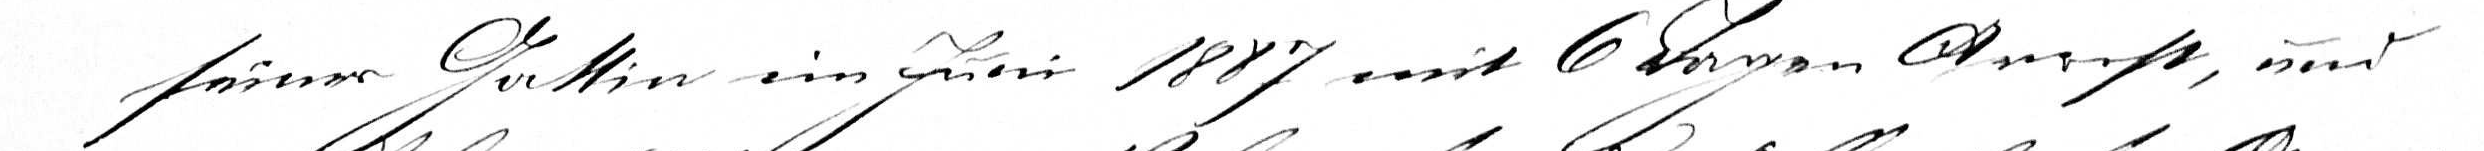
seiner Gattin ein Juni 1887 mit 6 Tagen Arrest, und
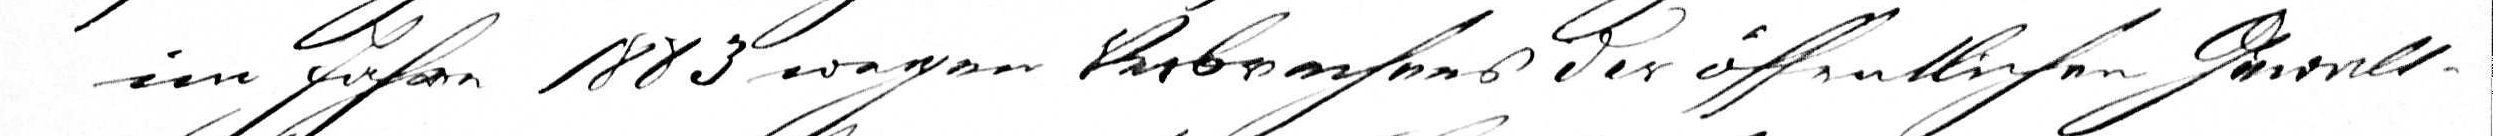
im Jahre 1883 wegen Verbrechens der öffentlichen Gewalt¬
